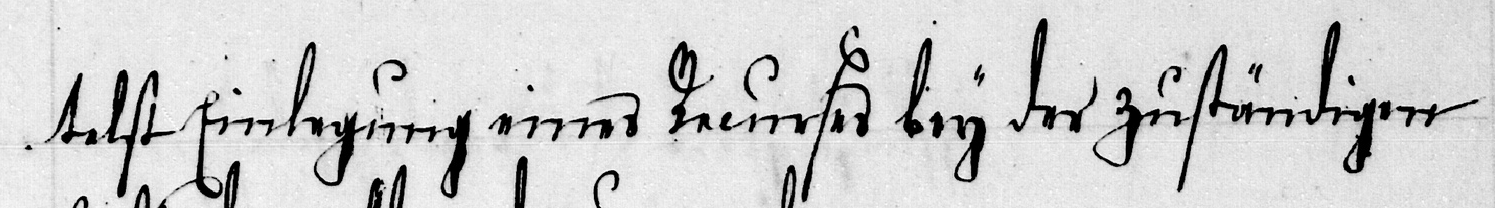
telst Einlegung eines Recurses bey der zuständigen
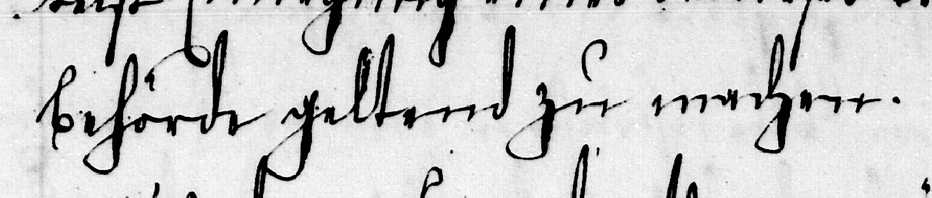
Behörde geltend zu machen.
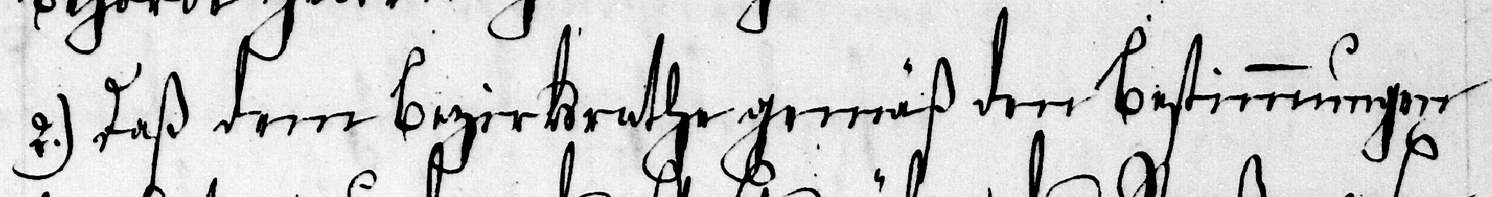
2.) Daß dem Bezirksrathe gemäß den Bestimmungen
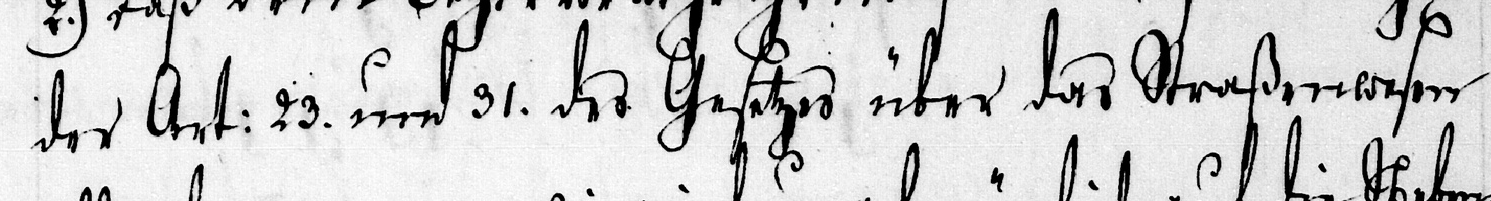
der Art: 23. und 31. des Gesetzes über das Straßenwesen
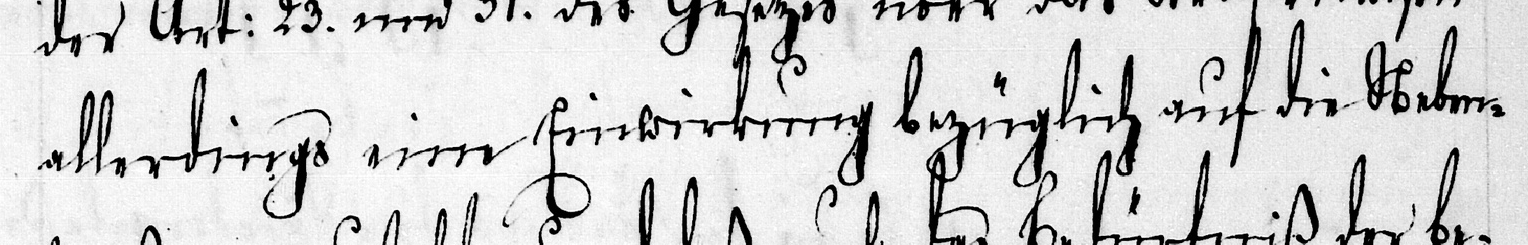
allerdings eine Einwirkung bezüglich auf die Neben¬
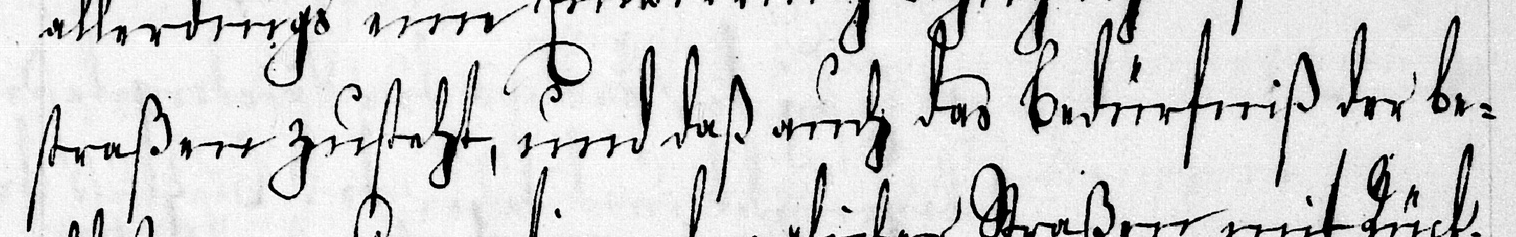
straßen zusteht, und daß auch das Bedürfniß der be¬
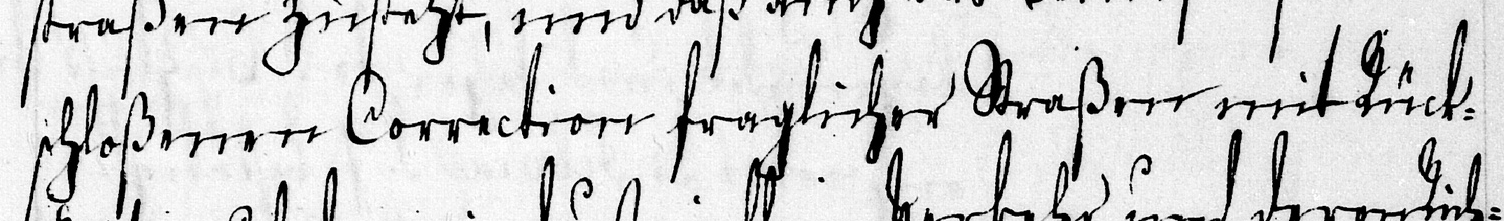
schloßenen Correction fraglicher Straßen mit Rück¬
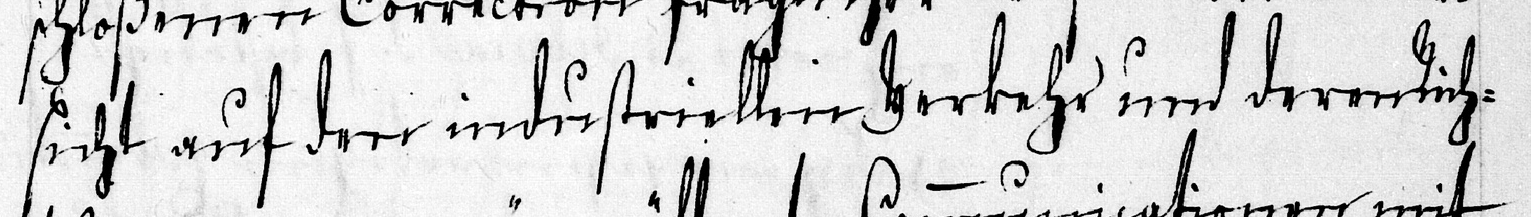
sicht auf den industriellen Verkehr und deren Ric¬
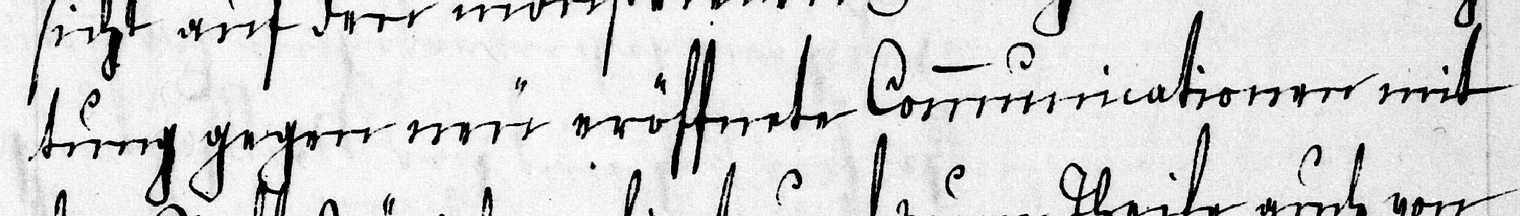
htung gegen neu eröffnete Communicationen mit
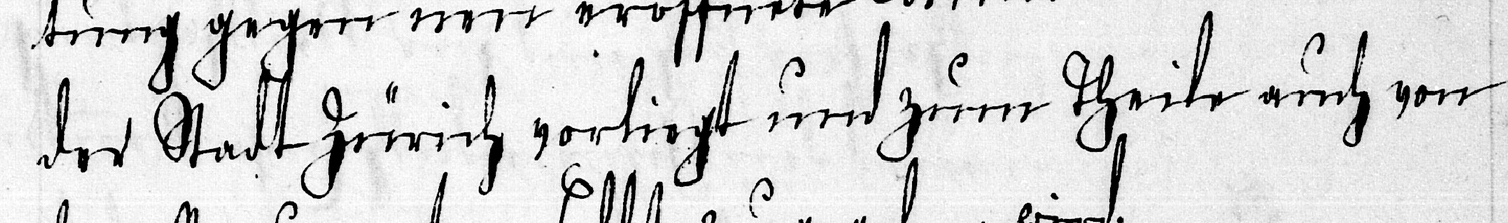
der Stadt Zürich vorliegt und zum Theile auch von
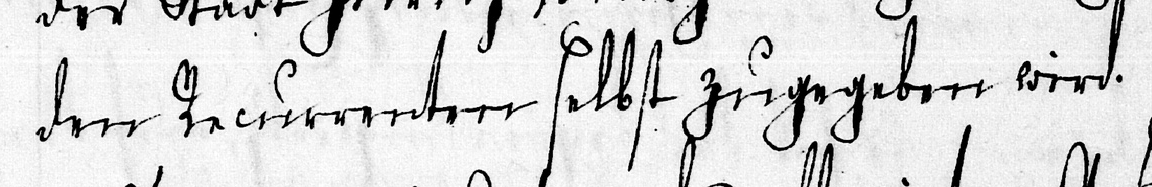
den Recurrenten selbst zugegeben wird.
